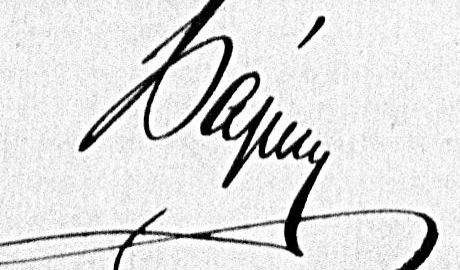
xx
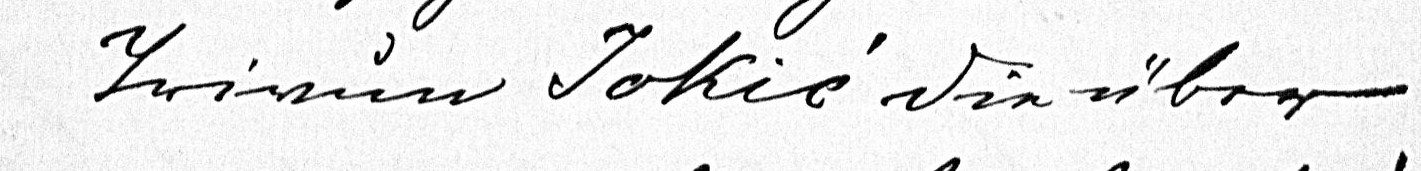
Trivun Jokić die über
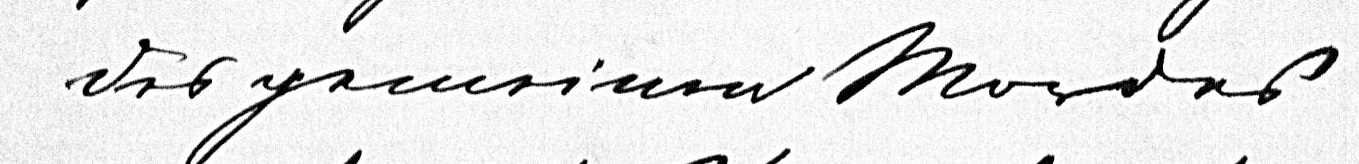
des gemeinen Mordes
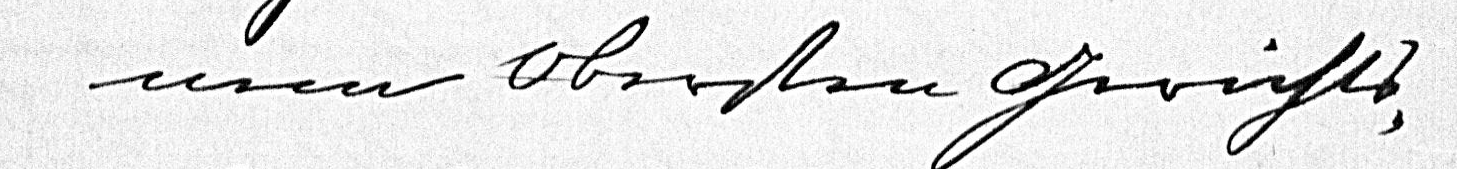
nem Obersten Gerichts-
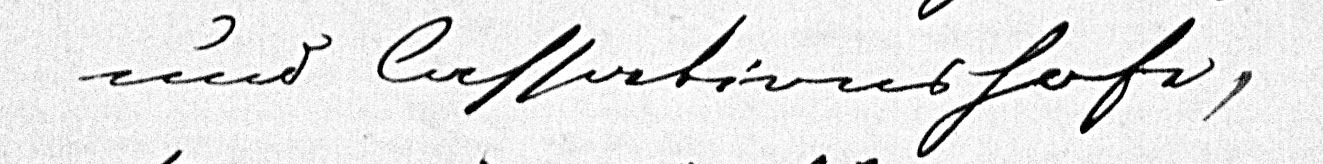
und Cassationshofe,
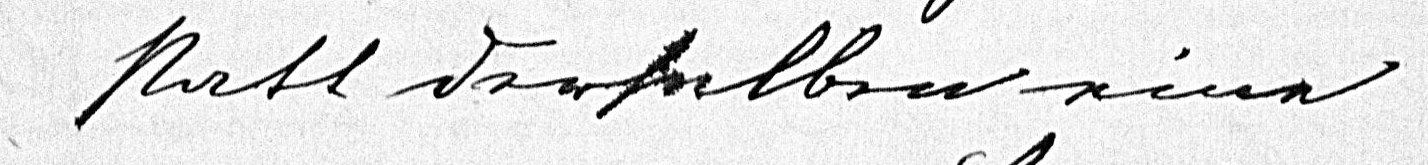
statt derselben eine
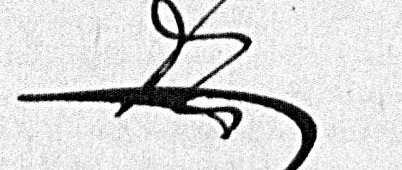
xx
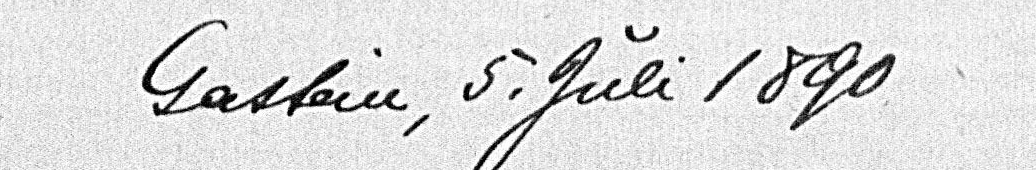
Gattein, 5. Juli 1890
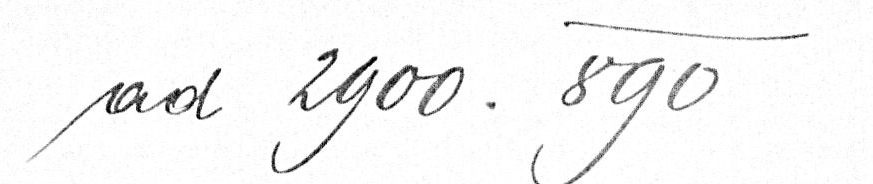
ad 2900. 890
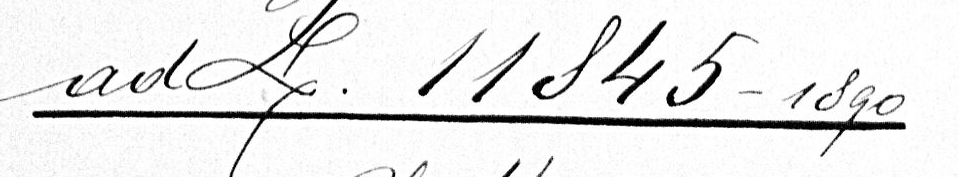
ad Z. 11845-1890
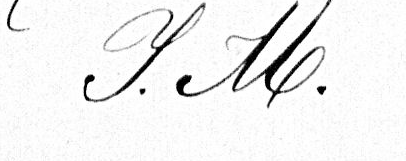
J. M.
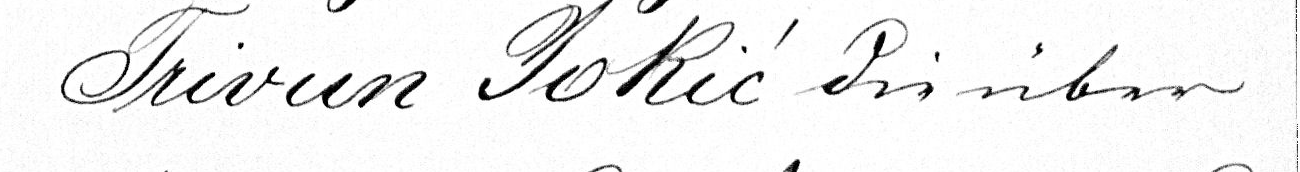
Trivun Jokić die über
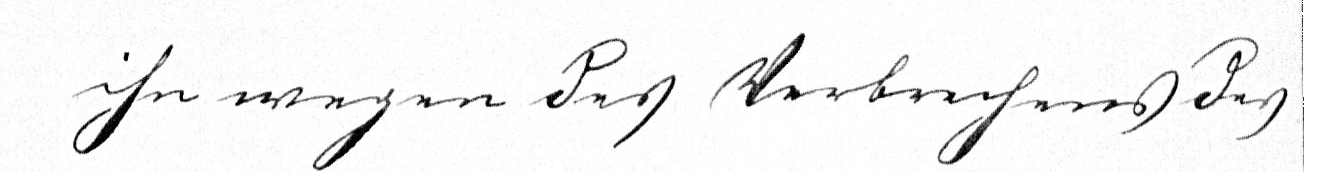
ihn wegen des Verbrechens des
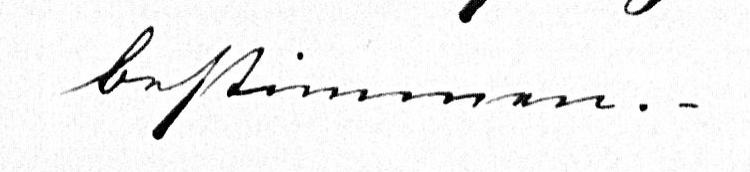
bestimmen.-
